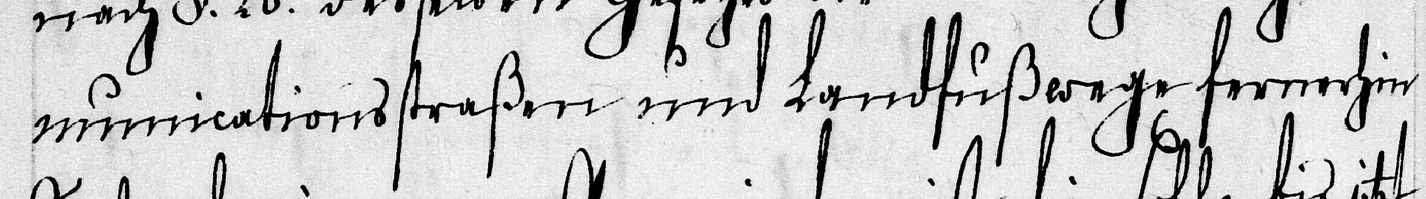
ommunicationsstraßen und Landfußwege fernerhin
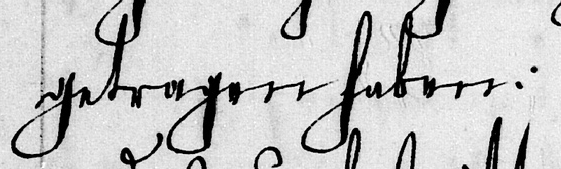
getragen haben:
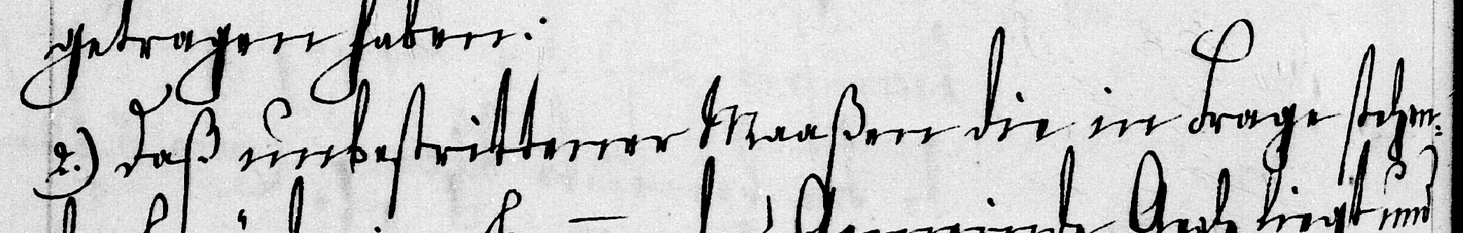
2.) Daß unbestrittener Maaßen die in Frage stehe¬
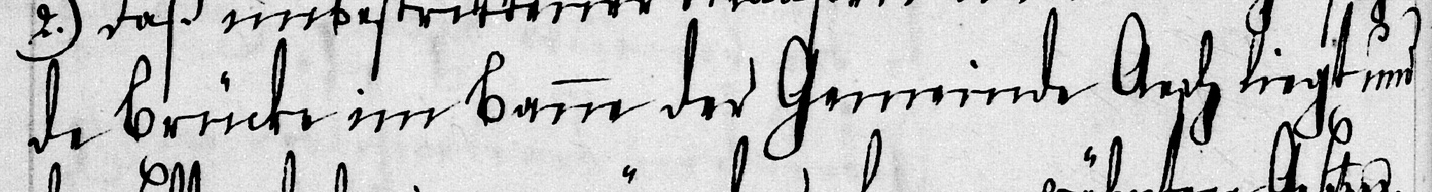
nde Brücke im Banne der Gemeinde Aesch liegt und
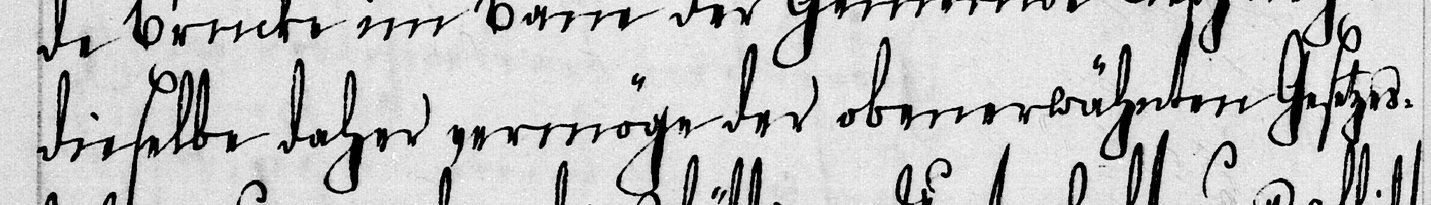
dieselbe daher vermöge der obenerwähnten Gesetze¬
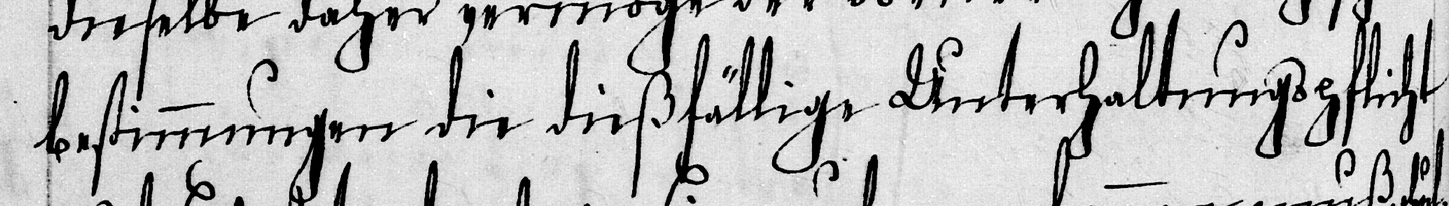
sbestimmungen die dießfällige Unterhaltungspflicht
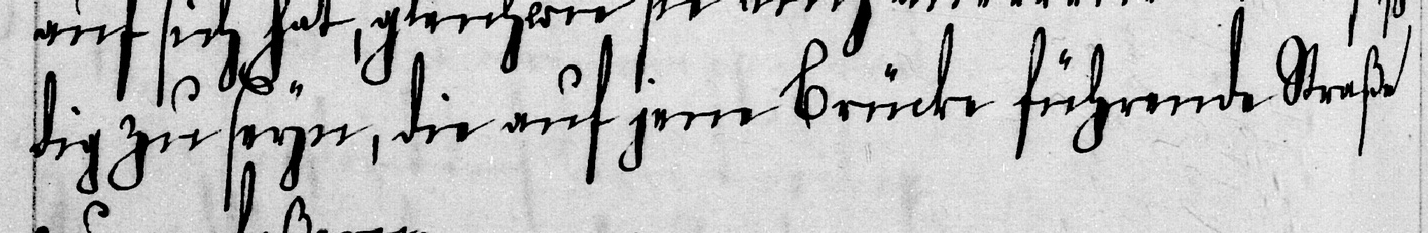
dig zu seyn, die auf jene Brücke führende Straße
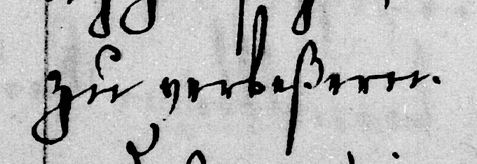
zu verbeßern.
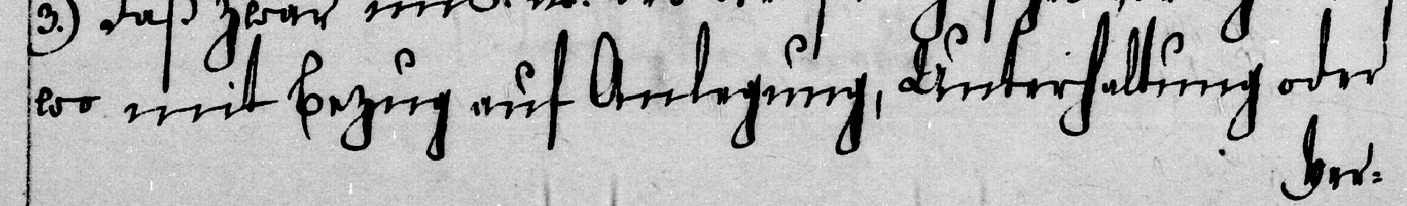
wo mit Bezug auf Anlegung, Unterhaltung oder
